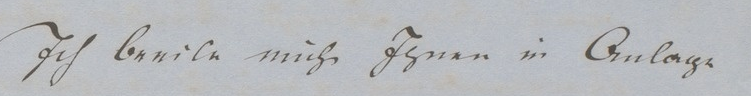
Ich beeile mich Ihnen in Anlage
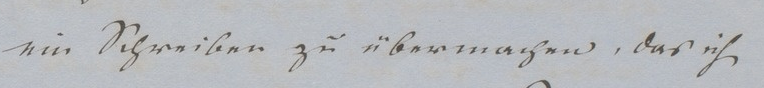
ein Schreiben zu übermachen, das ich
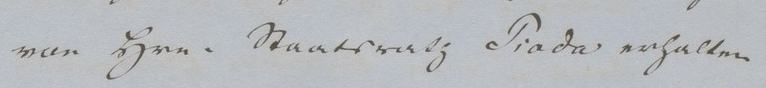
von Hrn. Staatsrath Pioda erhalten
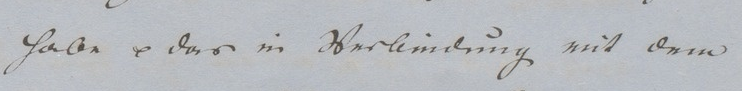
habe & das in Verbindung mit dem
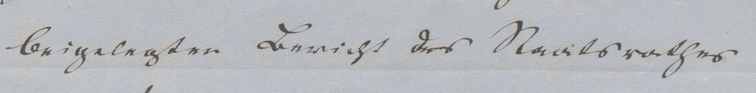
beigelegten Bericht des Staatsrathes
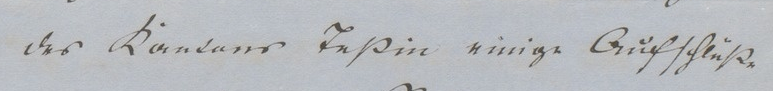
des Kantons Teßin einige Aufschlüße
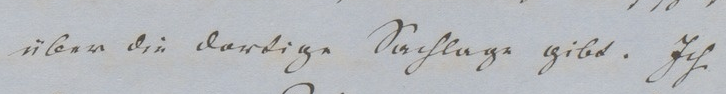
über die dortige Sachlage gibt. Ich
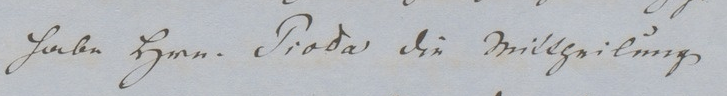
habe Hrn. Pioda die Mittheilung
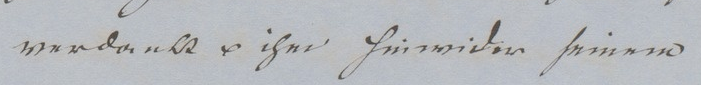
verdankt & ihm hinwider seinem
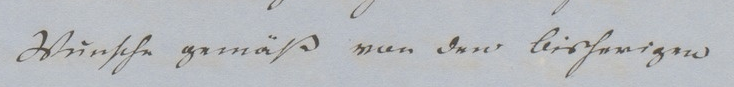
Wunsche gemäß von den bisherigen
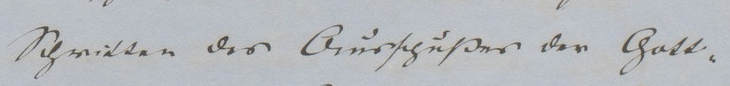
Schritten des Ausschußes der Gott-
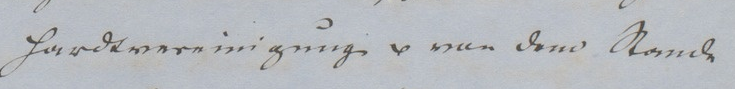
hardtvereinigung & von dem Stande
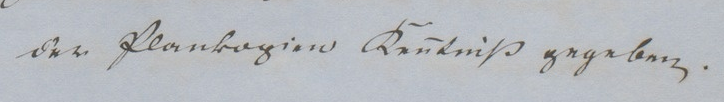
der Plankopien Kenntniß gegeben. –
